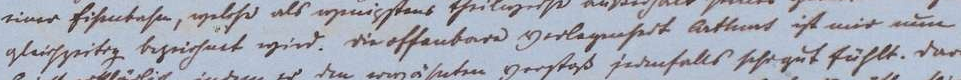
gleichzeitig bezeichnet wird. Die offenbare Verlegenheit Arthurs ist mir nun
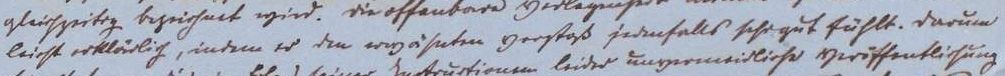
leicht erklärlich, indem er den erwähnten Verstoß jedenfalls sehr gut fühlt. Darum
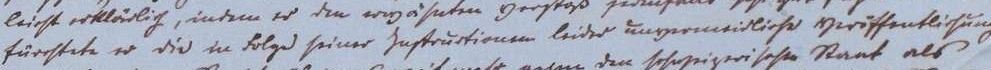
fürchtete er die in Folge seiner Instructionen leider unvermeidliche Veröffentlichung
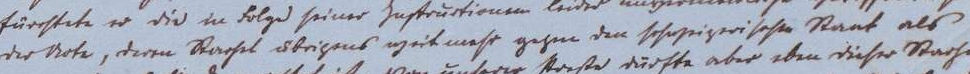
der Note, deren Stachel übrigens weit mehr gegen den schweizerischen Staat als
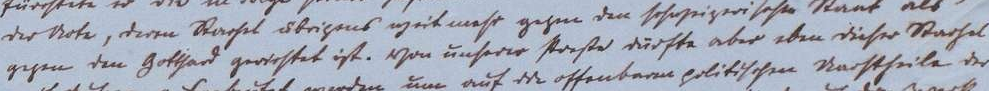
gegen den Gotthard gerichtet ist. Von unserer Preße dürfte aber eben dieser Stachel
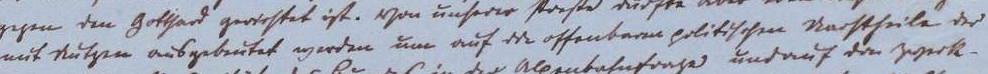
mit Nutzen ausgebeutet werden um auf die offenbaren politischen Nachtheile der
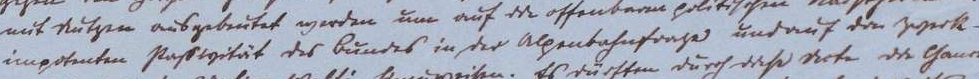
impotenten Passivität des Bundes in der Alpenbahnfrage und auf die Zweck-
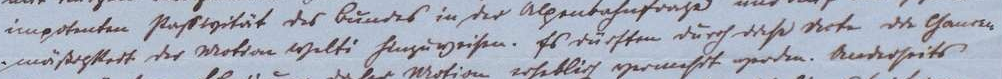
mäßigkeit der Motion Welti hinzuweisen. Es dürften durch diese Note die Chancen
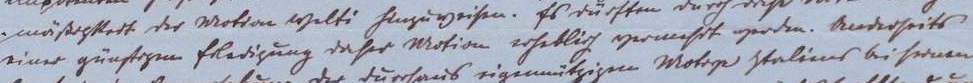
einer günstigen Erledigung dieser Motion erheblich vermehrt werden. Anderseits
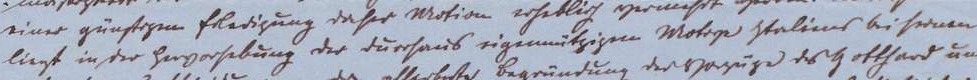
liegt in der Hervorhebung der durchaus eigennützigen Motive Italiens bei seinen
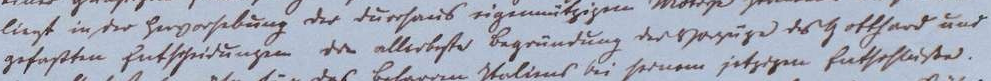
gefaßten Entscheidungen die allerbeste Begründung der Vorzüge des Gotthard und
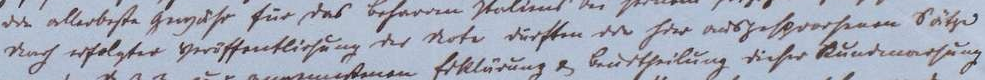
Nach erfolgter Veröffentlichung der Note dürften die hier ausgesprochenen Sätze
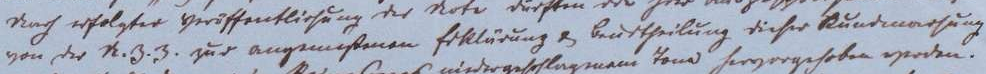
von der N.Z.Z. zur angemeßenen Erklärung & Beurtheilung dieser Kundmachung
